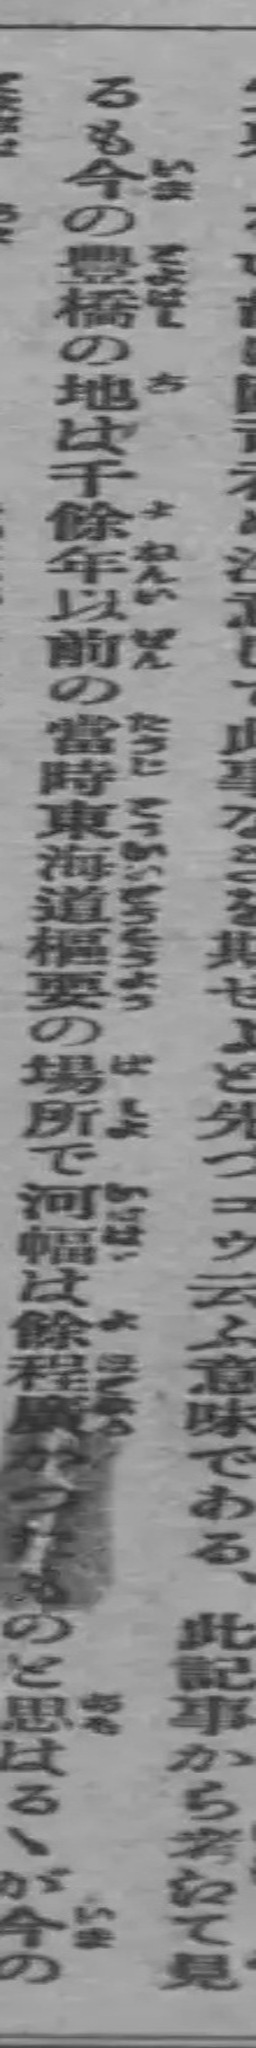るも今の豊橋の地は千余年以前の当時東海道枢要の場所で河幅は余程広かつたものと思はるゝが今の
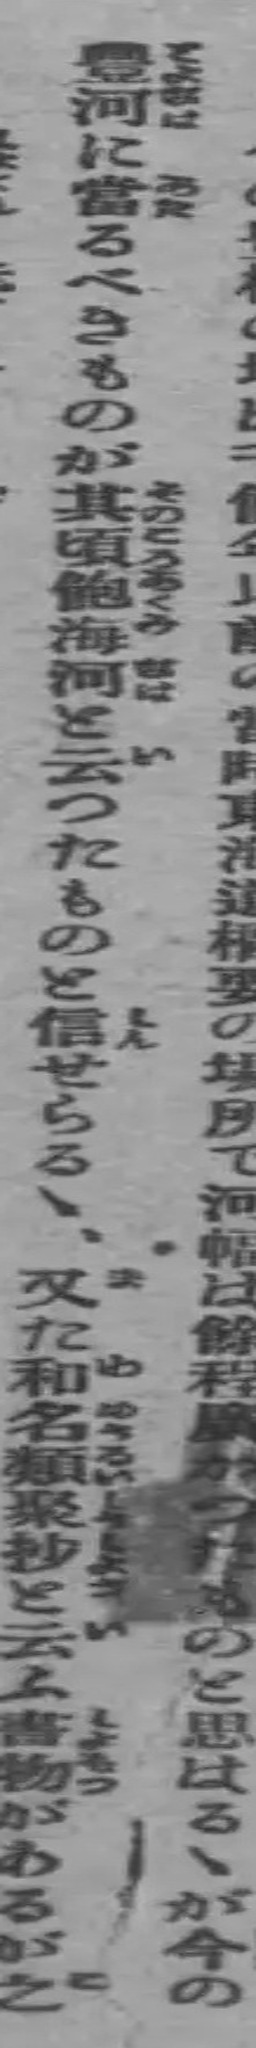豊河に当るべきものが其頃飽海河と云つたものと信せらるゝ、又た和名類聚抄と云ふ書物があるが之
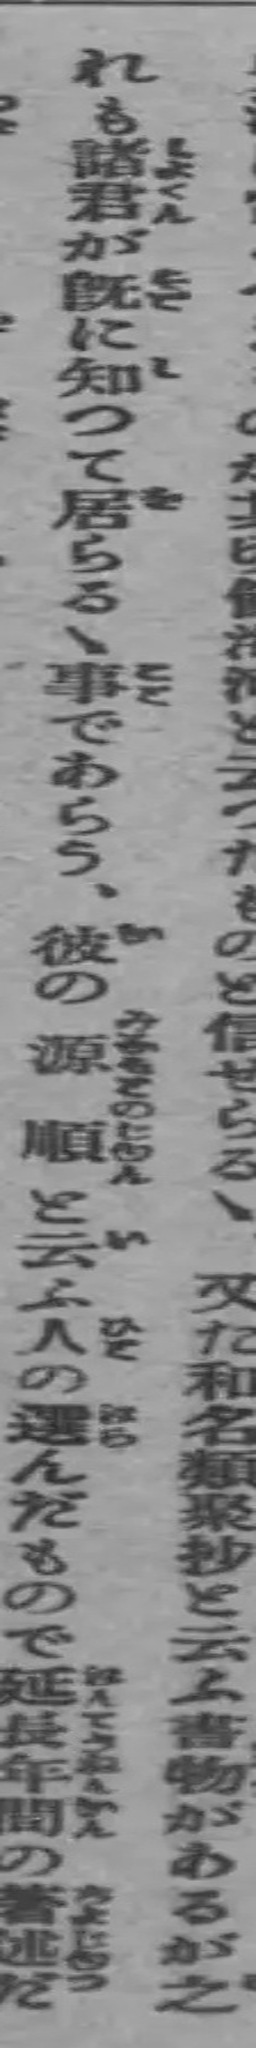れも諸君が既に知つて居らるゝ事であらう、彼の源順と云ふ人の選んだもので延長年間の著述だ
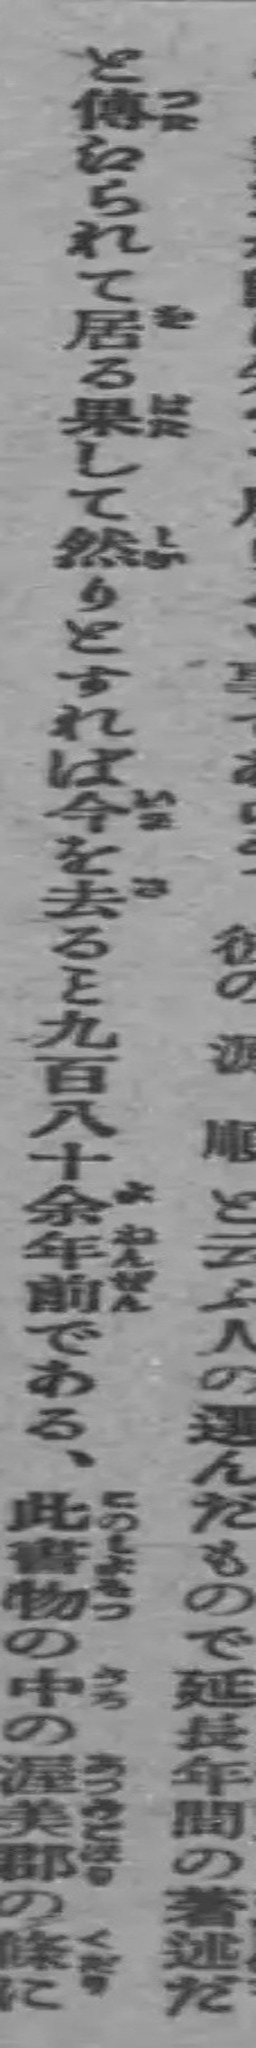と伝えられて居る果して然りとすれば今を去ること九百八十余年前である、此書物の中の渥美郡の条に
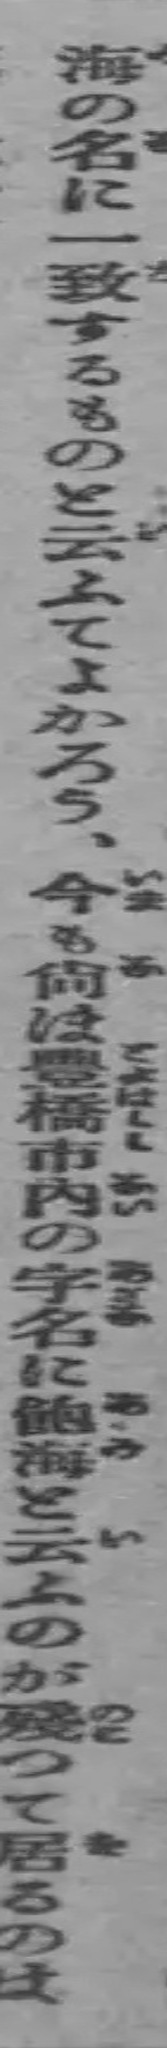海の名に一致するものと云ふてよかろう、今も尚ほ豊橋市内の字名に飽海と云ふのが残つて居るのは
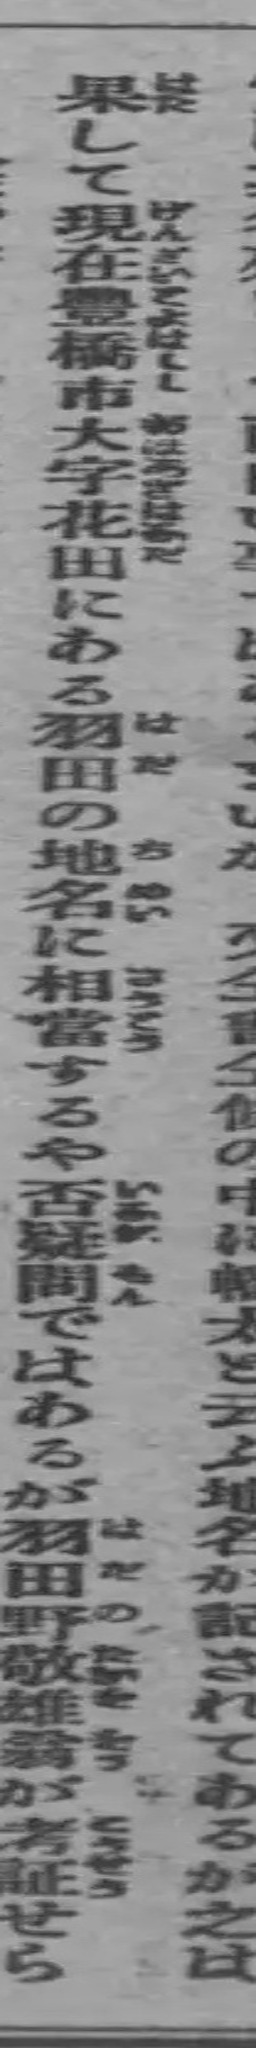果して現在豊橋市大字花田にある羽田の地名に相当するや否疑問ではあるが羽田野敬雄翁が考証せら
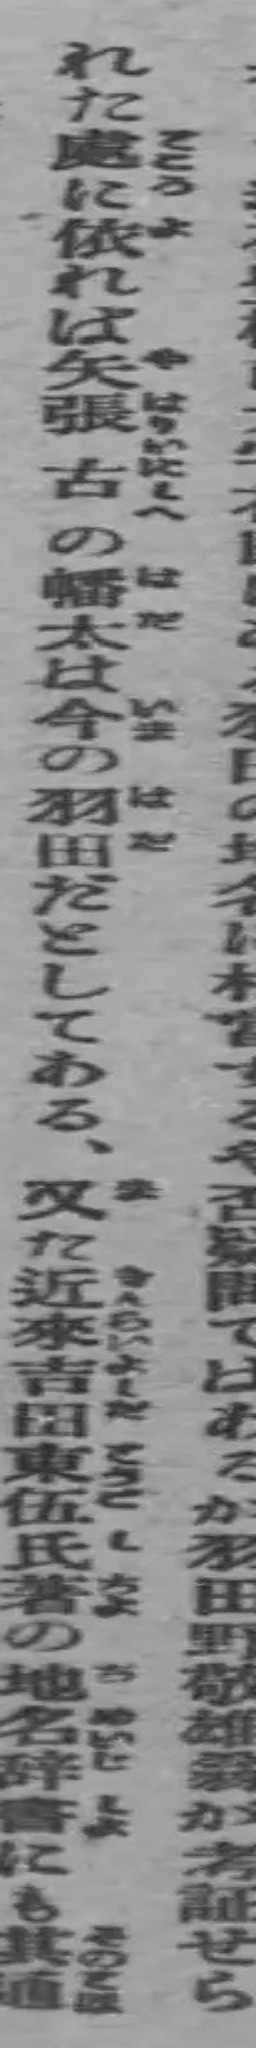れた処に依れば矢張古の幡太は今の羽田だとしてある、又た近来吉田東伍氏著の地名辞書にも其通
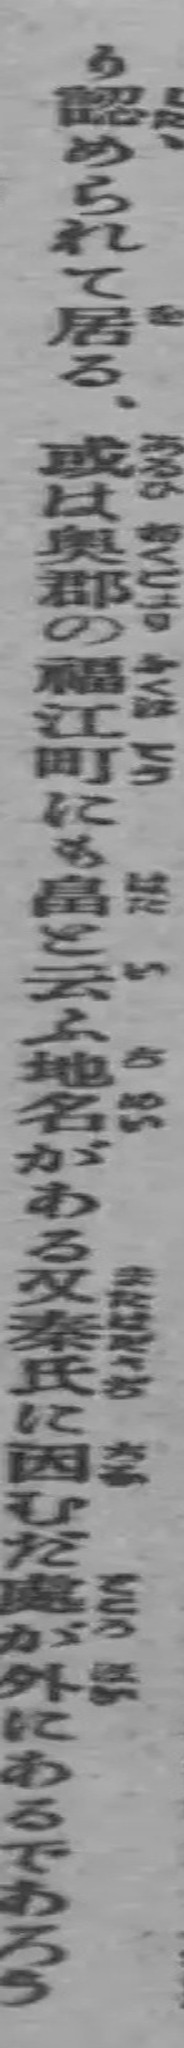り認められて居る、或は奥郡の福江町にも畠と云ふ地名がある又秦氏に因むだ処が外にあるであろう
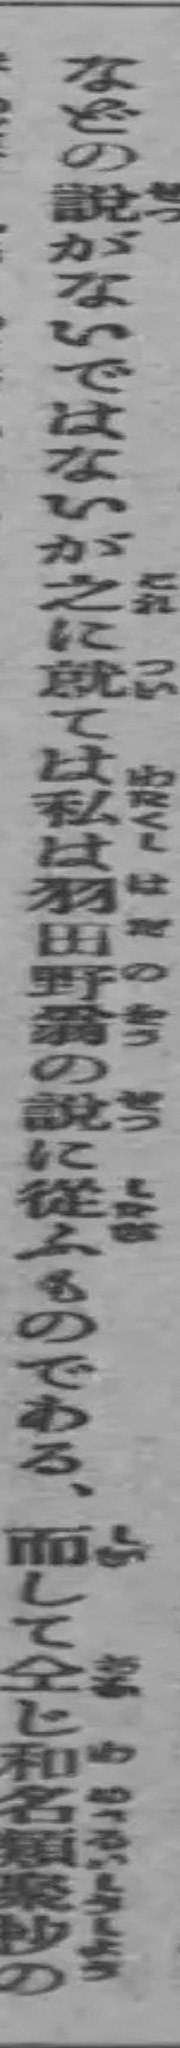などの説がないではないが之に就ては私は羽田野翁の説に従ふものである、而して仝じ和名類聚抄の
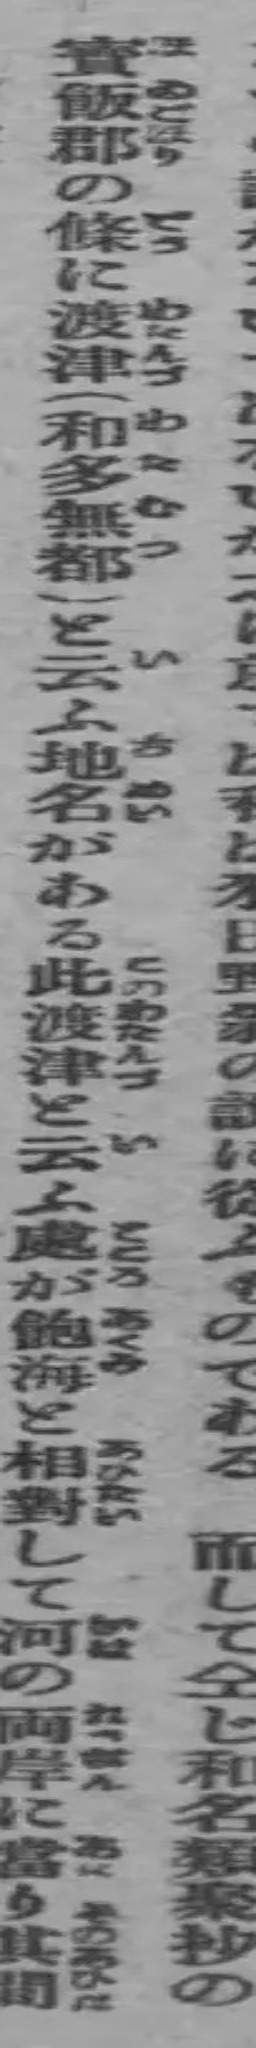渡津宝飯郡の条に渡津(和多無都)と云ふ地名がある此渡津と云ふ処が飽海と相対して河の両岸に当り其間
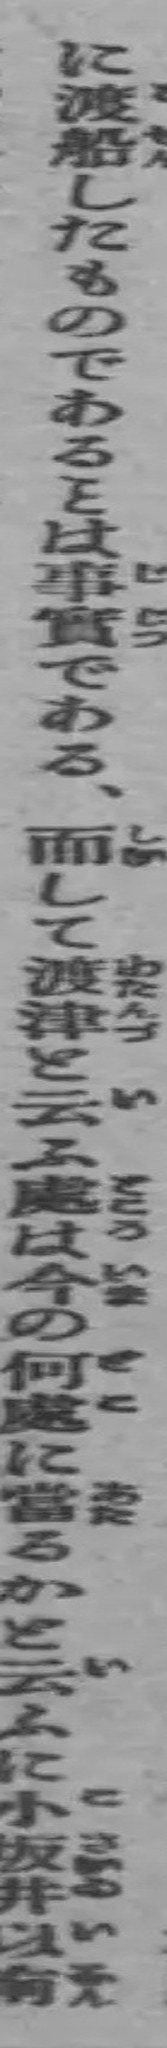に渡船したものであることは事実である、而して渡津と云ふ処は今の何処に当るかと云ふに小坂井以南
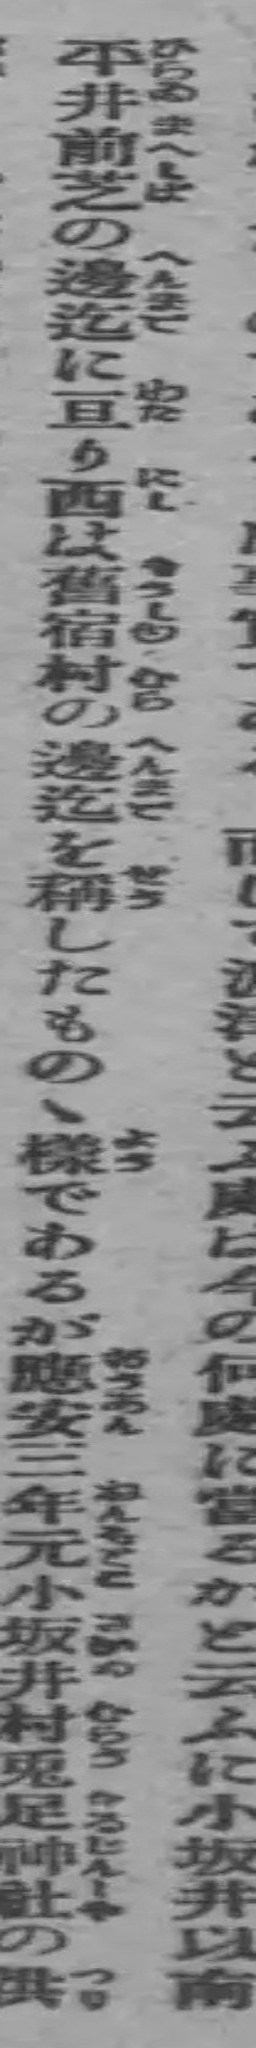平井前芝の辺迄に亘り西は旧宿村の辺迄を称したものゝ様であるが応安三年元小坂井村兎足神社の洪
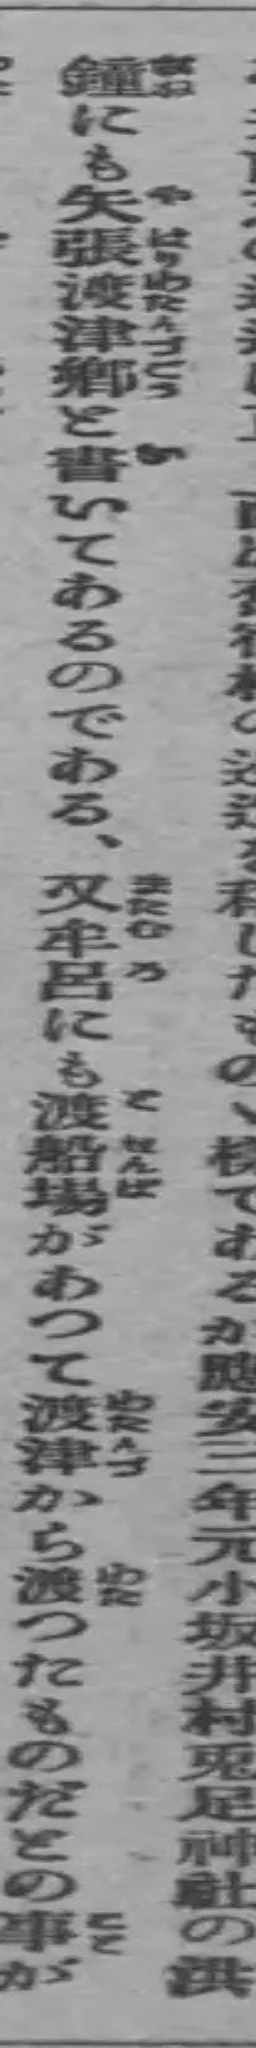鐘にも矢張渡津郷と書いてあるのである、又牟呂にも渡船場があつて渡津から渡つたものだとの事が
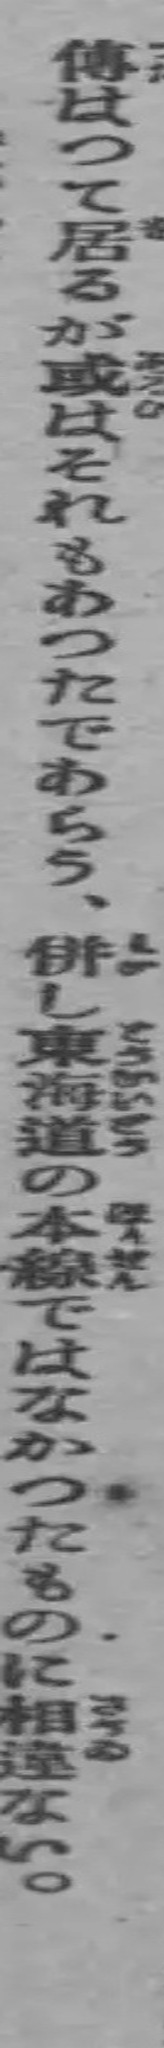伝はつて居るが或はそれもあつたであらう、併し東海道の本線ではなかつたものに相違ない。
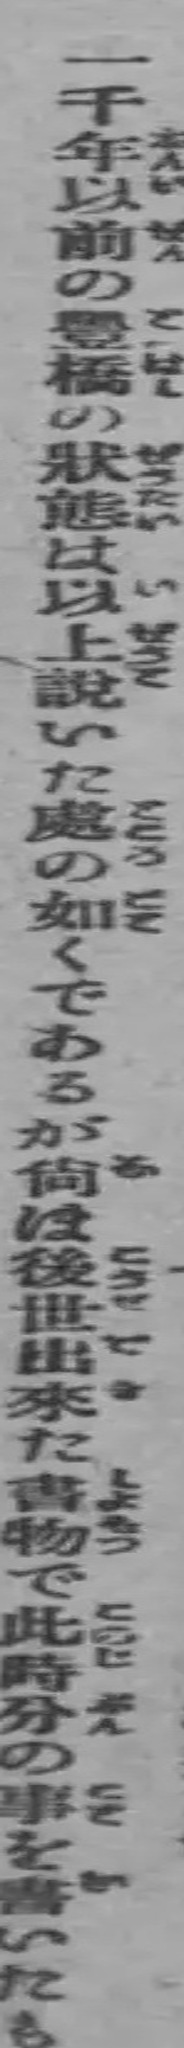一千年以前の豊橋の状態は以上説いた処の如くであるが尚ほ後世出来た書物で此時分の事を書いたも
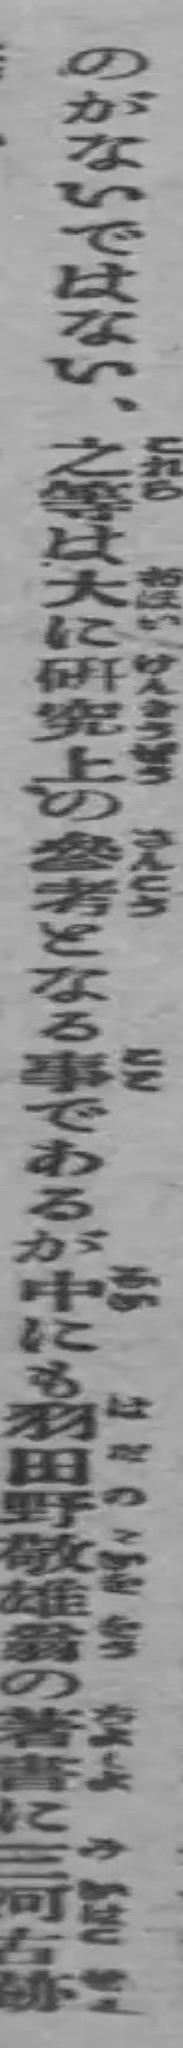のがないではない、之等は大に研究上の参考となる事であるが中にも羽田野敬雄翁の著書に三河古跡
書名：豊橋市史談
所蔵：国立国会図書館 National Diet Library, JAPAN
